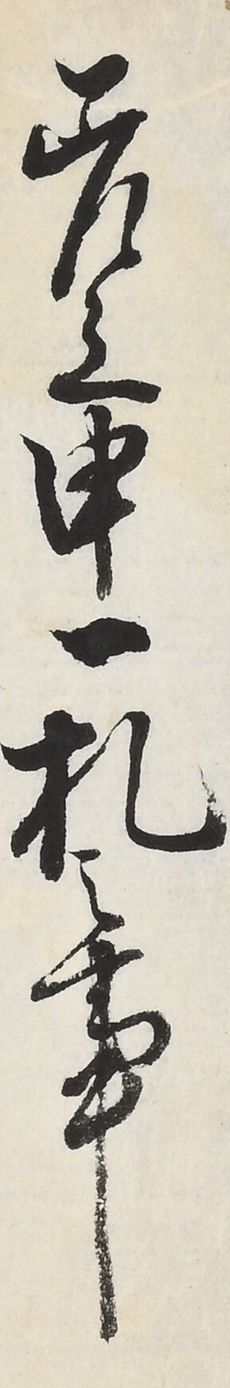差上申一札之事
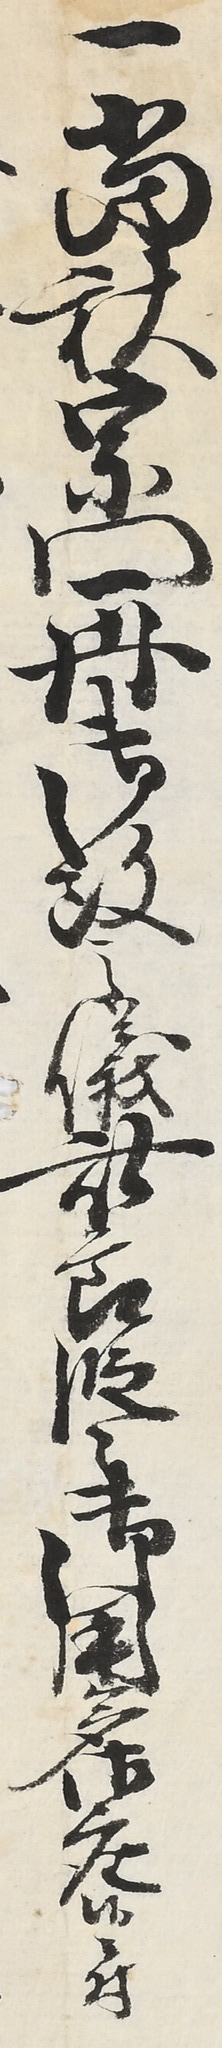一当秋宗門再御改之儀此節段々御用多御座候ニ付
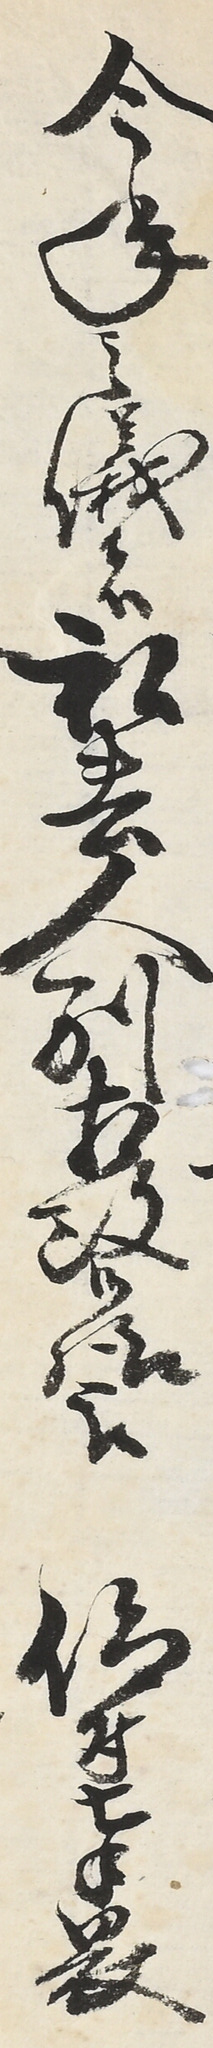今年之儀者私共人別相改候様被仰付奉畏
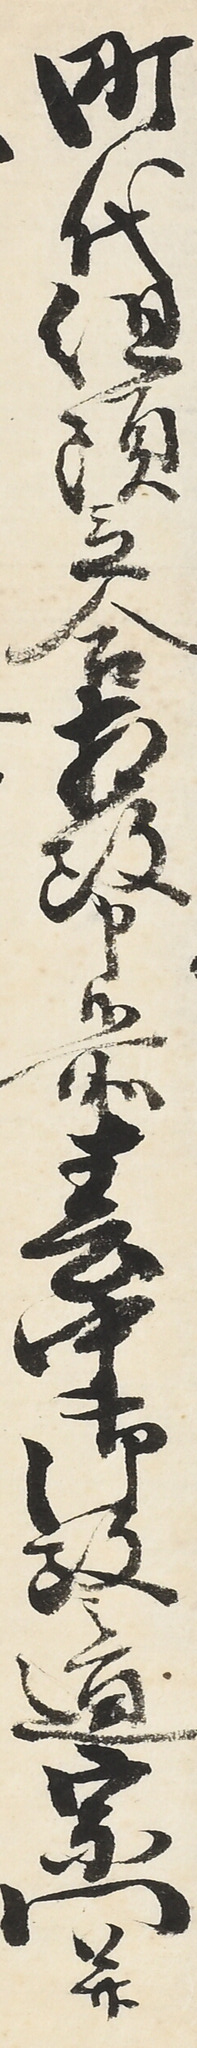町代組頭立合相改申候所春中御改之通宗門幷
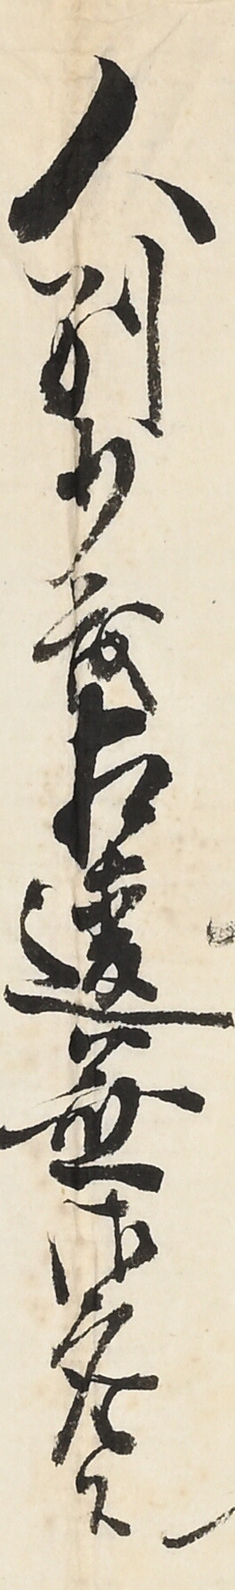人別少茂相違無御座候
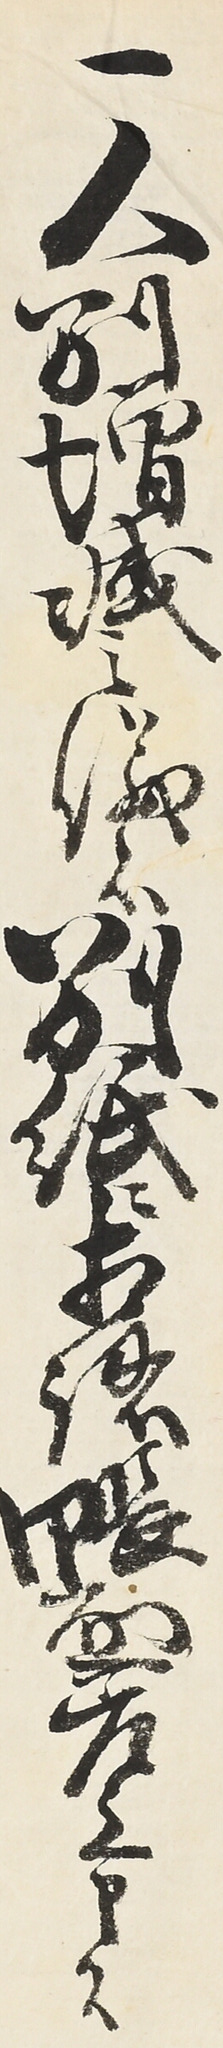一人別増減之儀者別紙ニ相認帳面差上申候
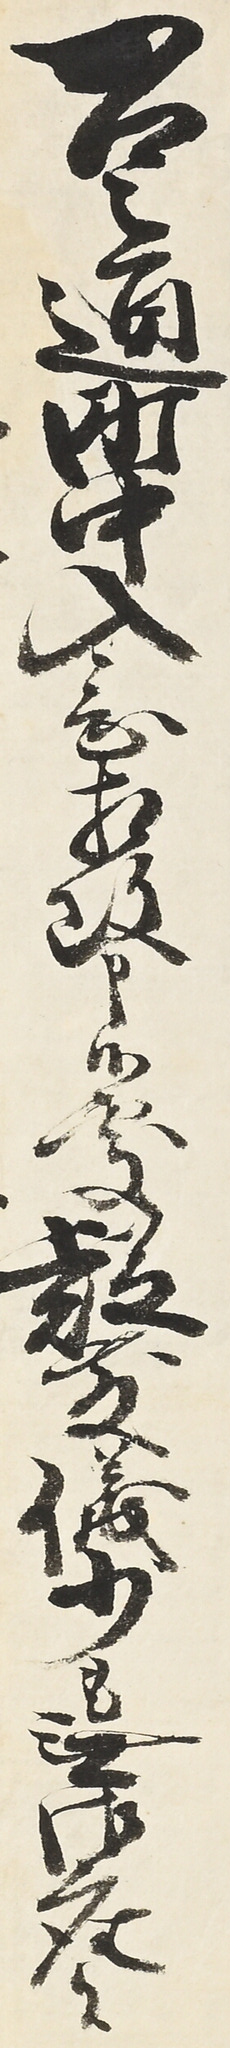右之通町中入念相改申候処疑敷儀少も無御座候
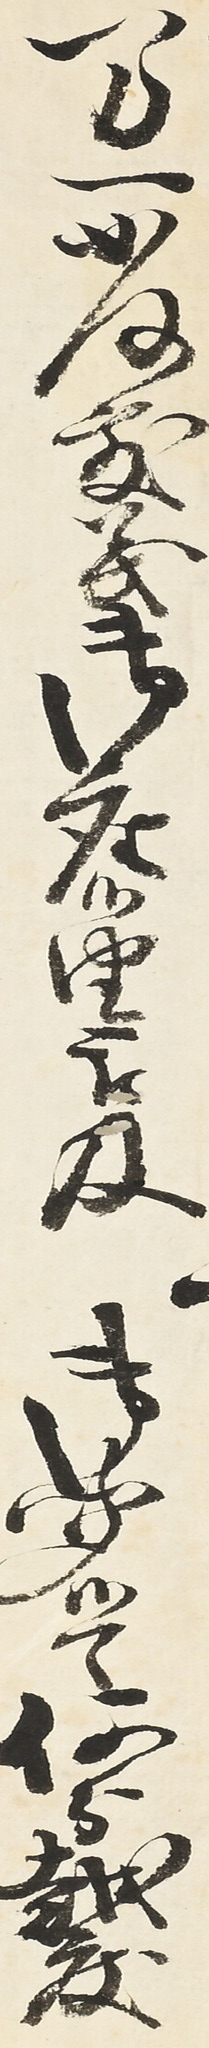万一如何敷義御座候由被及御聞候ハゝ何分越度
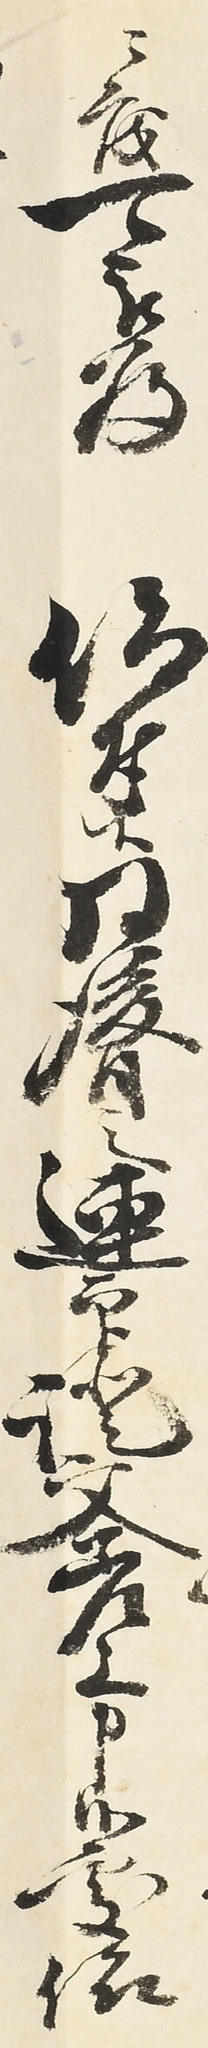ニ茂可被為仰付候為後日之連印証文差上申候処依
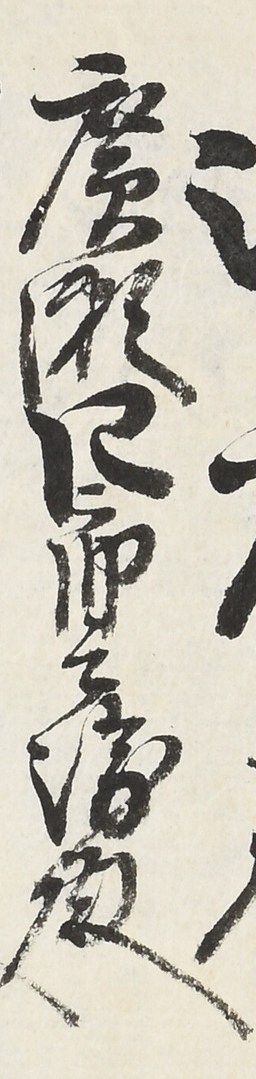広瀬四郎兵衛殿
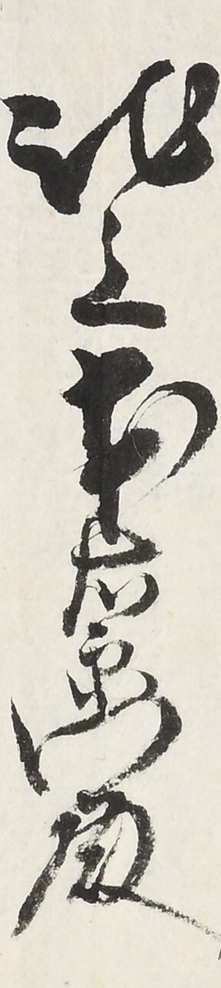池上本右衛門殿

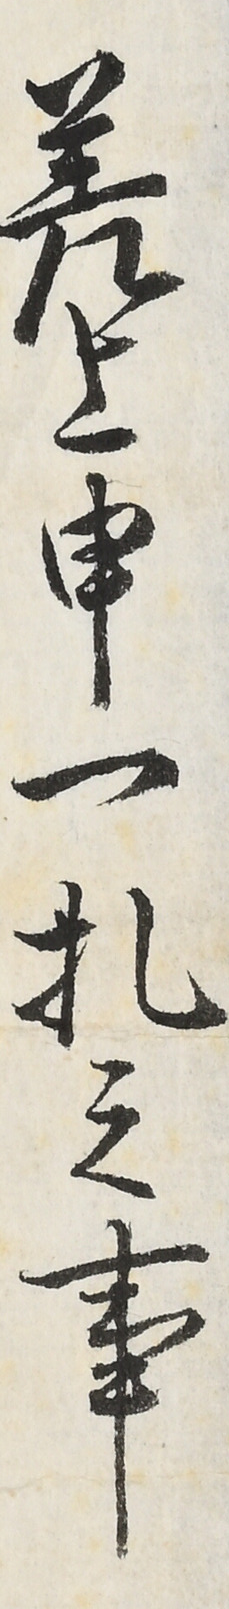差上申一札之事
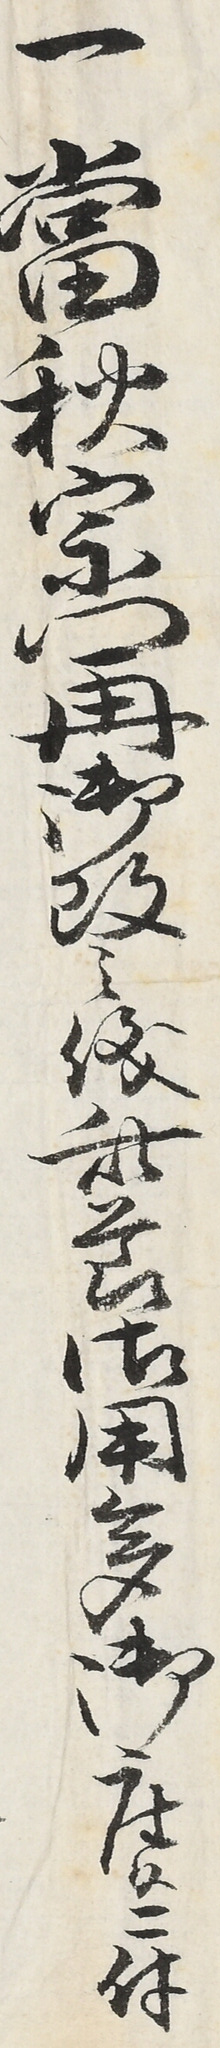一当秋宗門再御改之儀此節御用多御座候ニ付
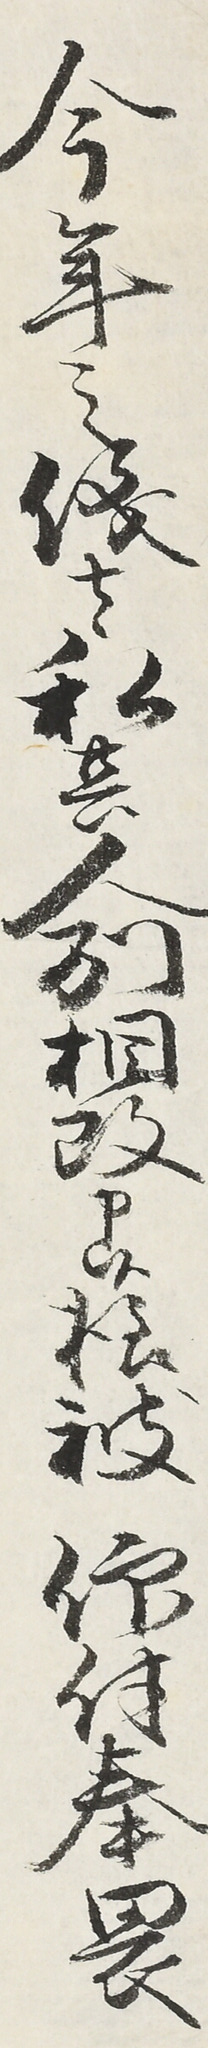今年之儀者私共人別相改申候様被仰付奉畏
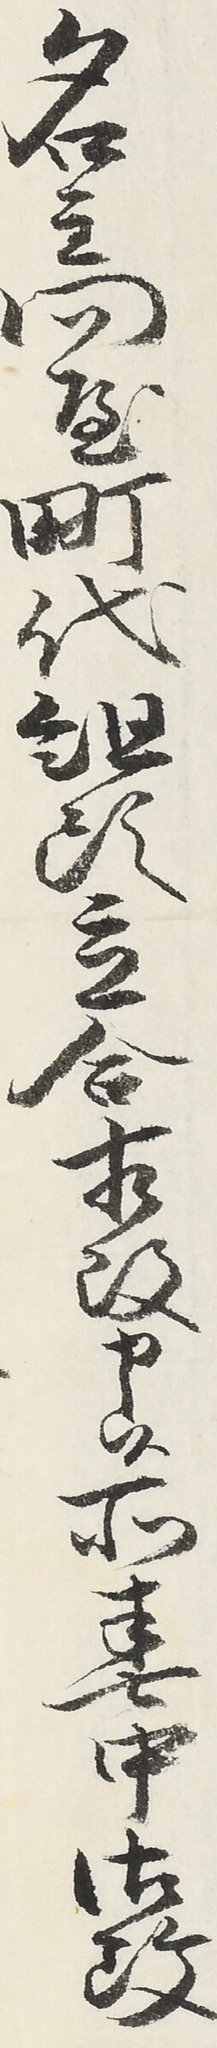名主問屋町代組頭立合相改申候所春中御改
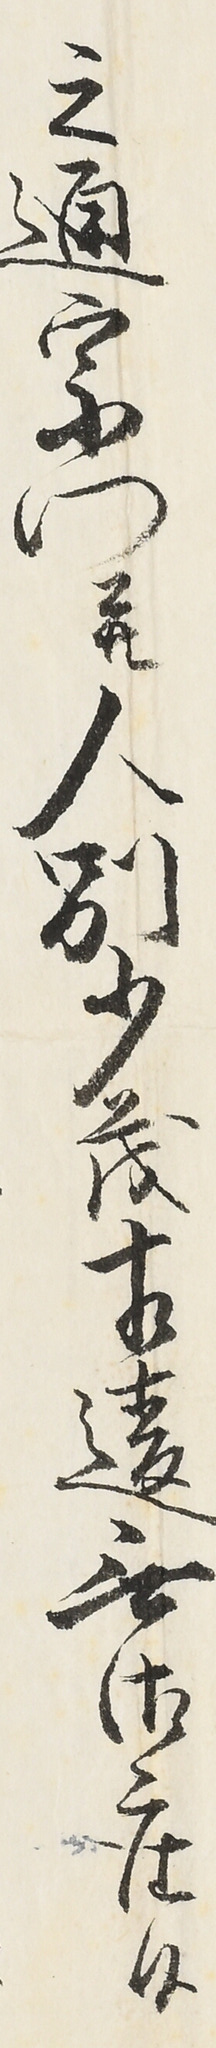之通宗門幷人別少茂相違無御座候
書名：差上申一札之事
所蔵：伊那市立高遠町図書館・合同会社AMANE
